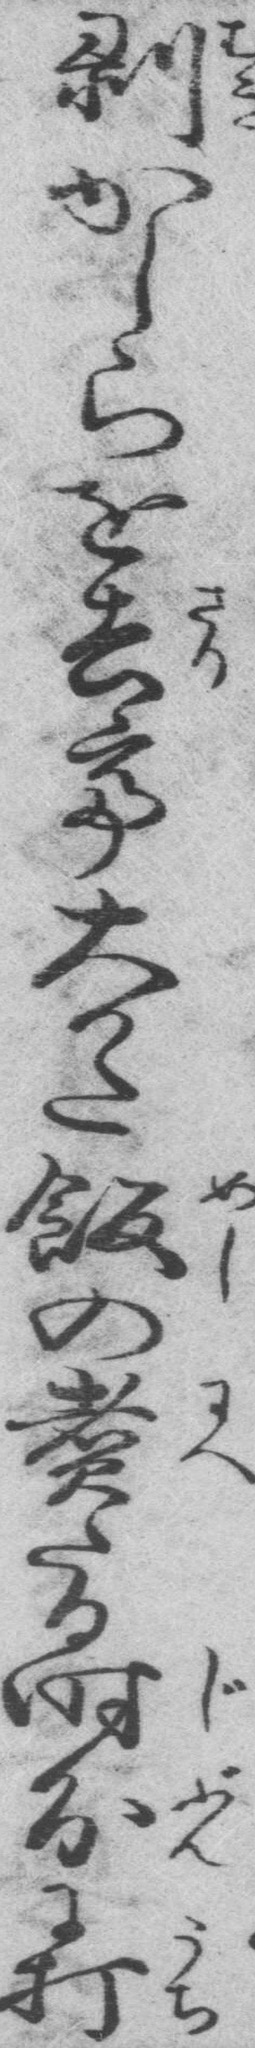剥かしらを去亭大かた飯の煮たる時分尓打
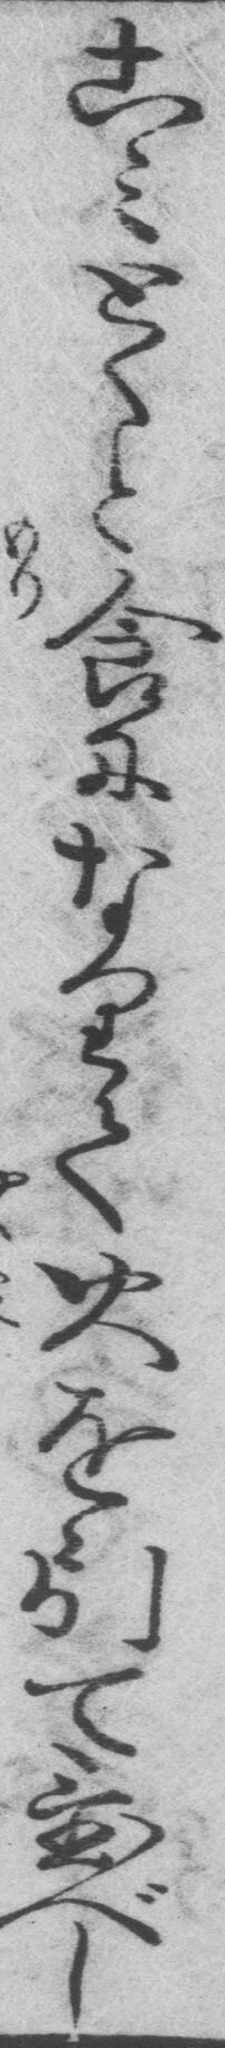古みとくと食丹な里て火を引て置べし
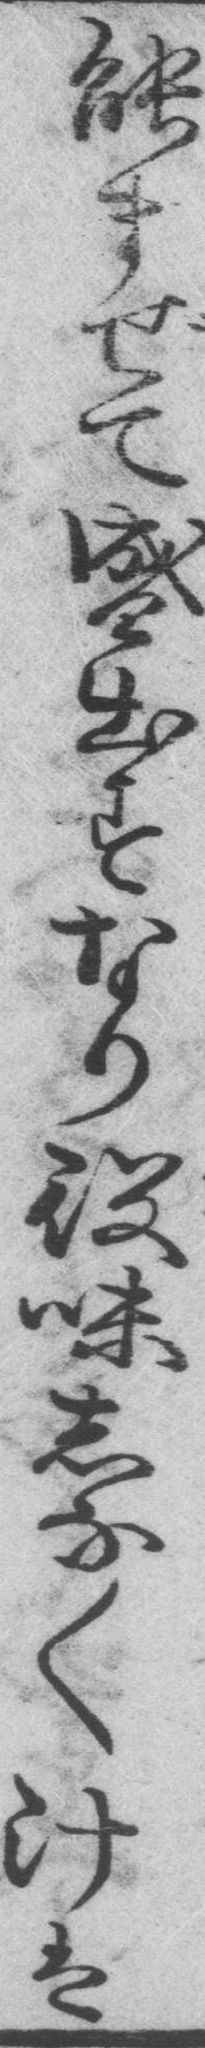能まぜて盛出春なり役味志な〳〵汁盤
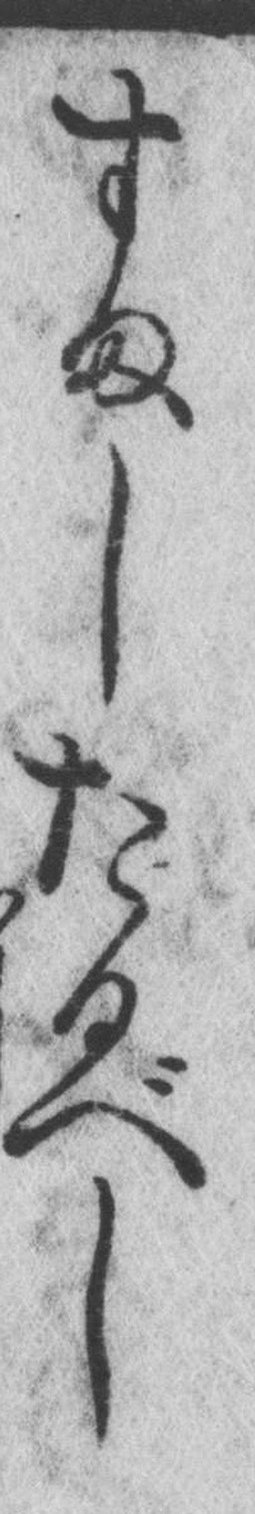すましたるべし
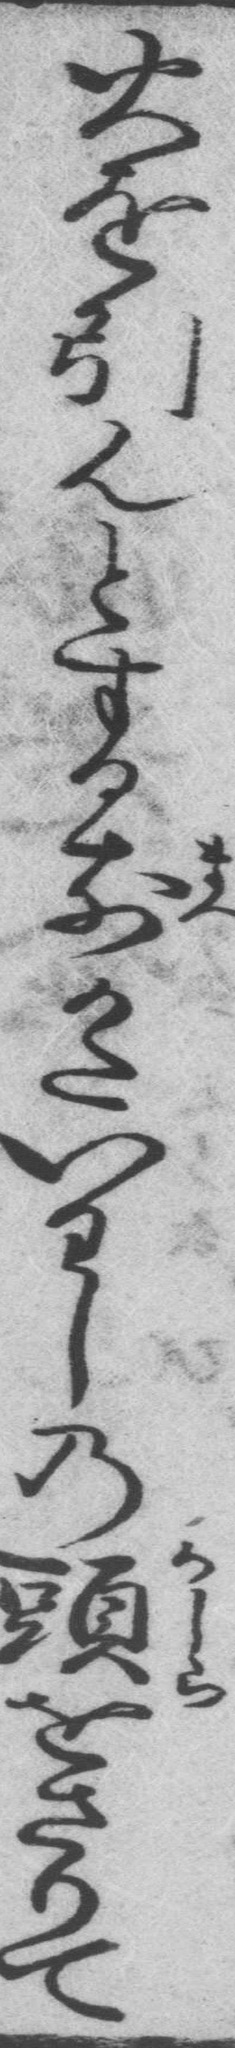火を引んとする前かたいわし乃頭をさりて
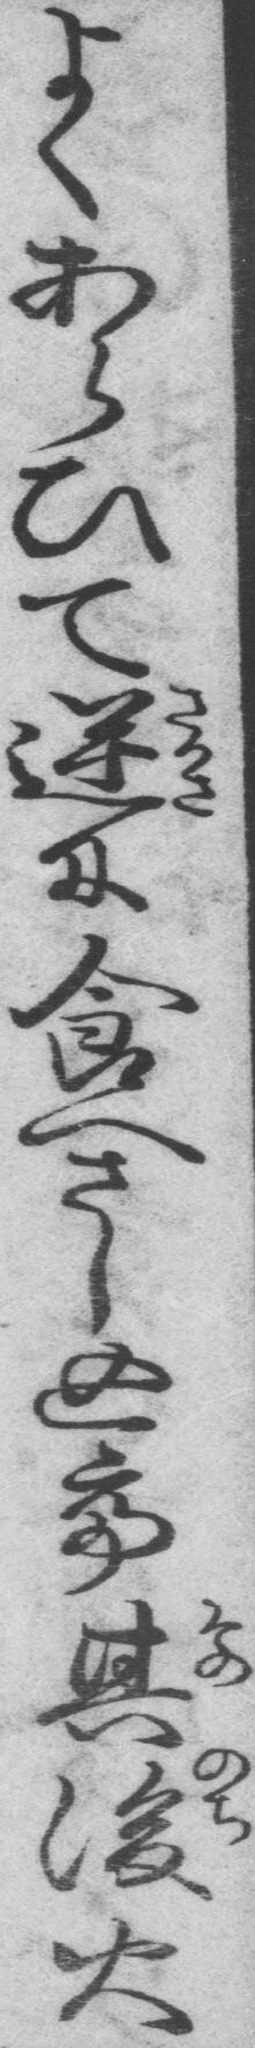よくあらひて逆丹食へさし込亭其後火
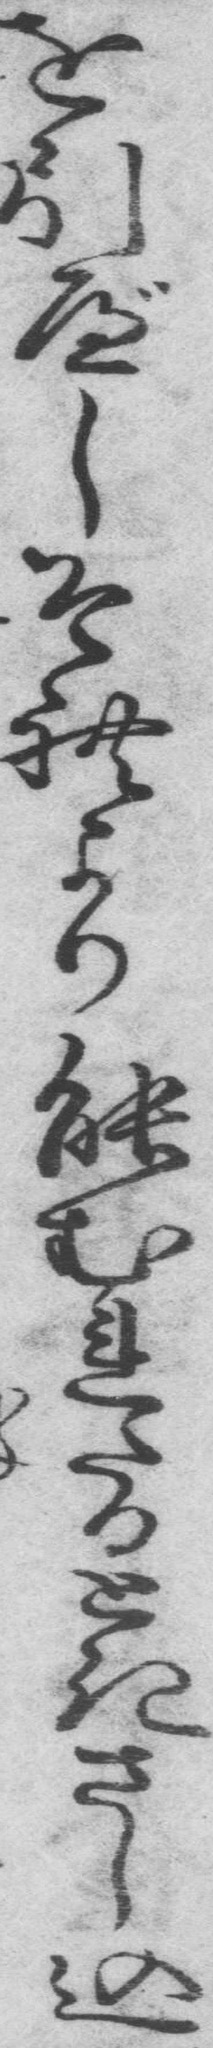を引べしそ禮より能む連たると起さし込
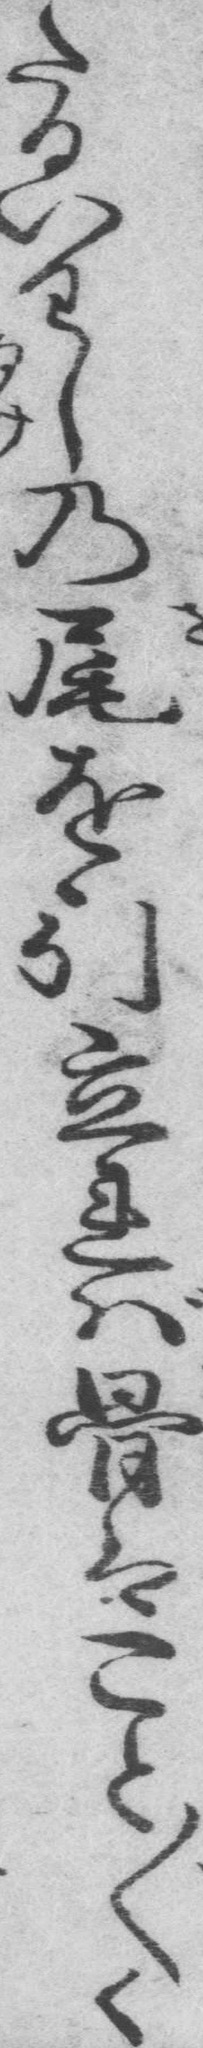たるいわし乃尾を引立連ば骨盤こと〴〵く
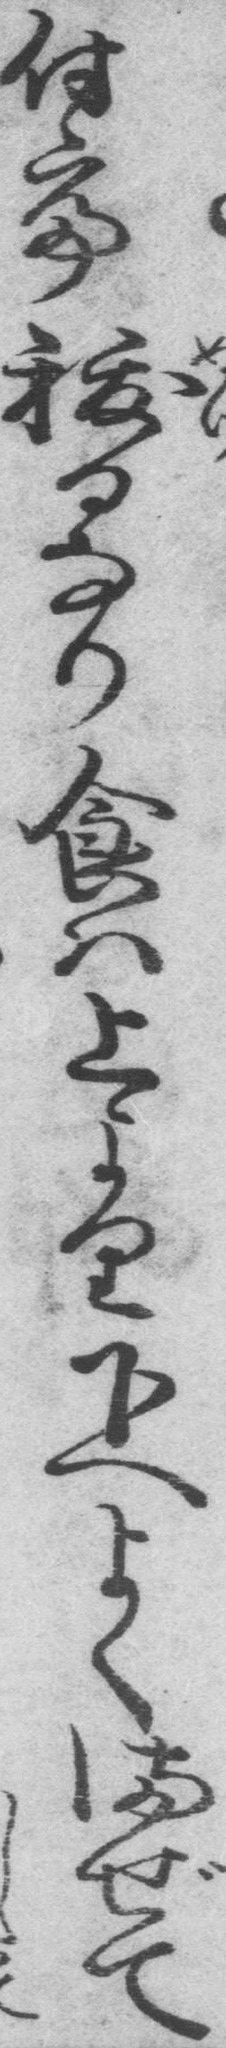付亭抜るなり食は上よ里下へよく満ぜて
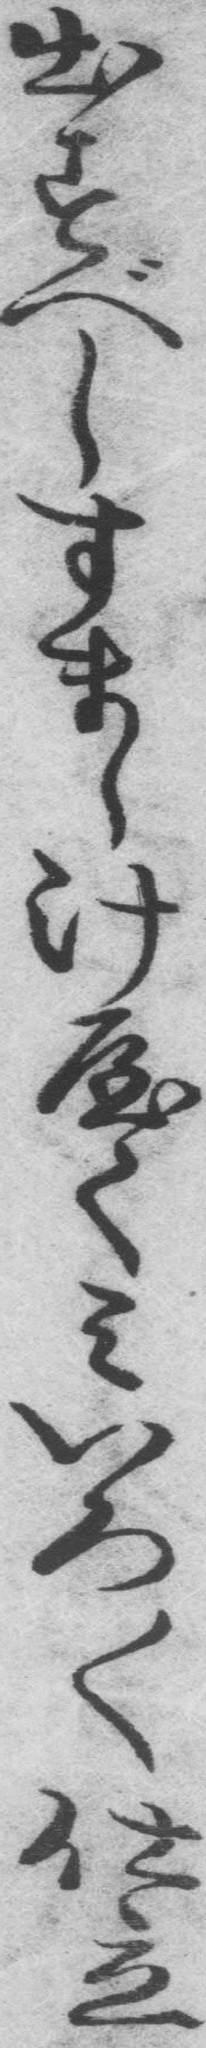出春べしすまし汁屋くみいろ〳〵仕立
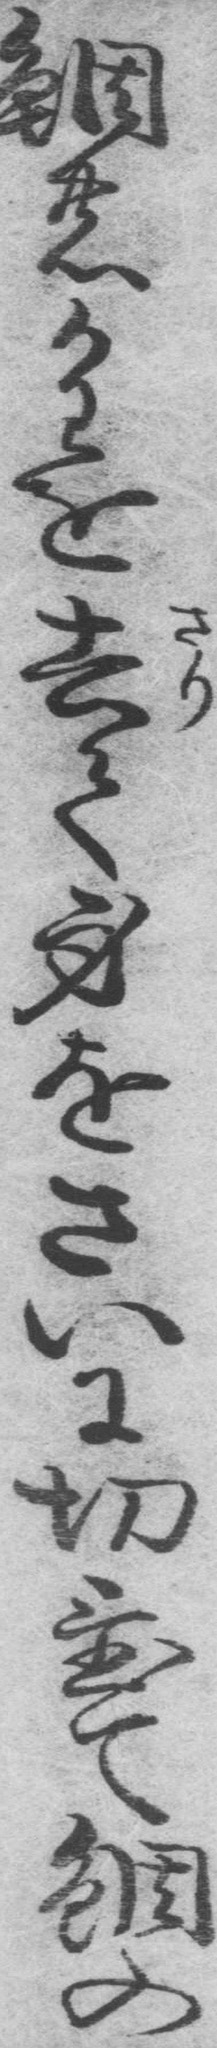鯛農かわを去て身をさい尓切置て鯛の
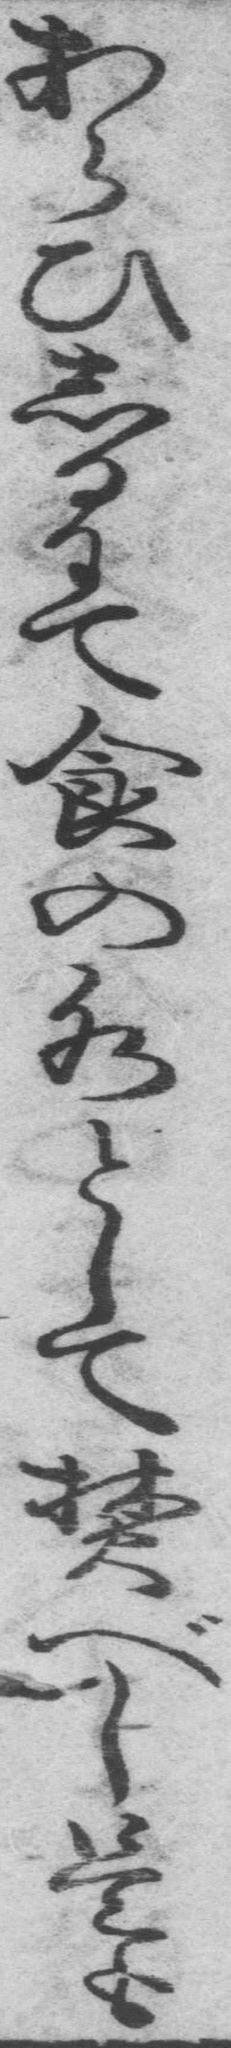あらひ志る尓て食の水として焚べし是も

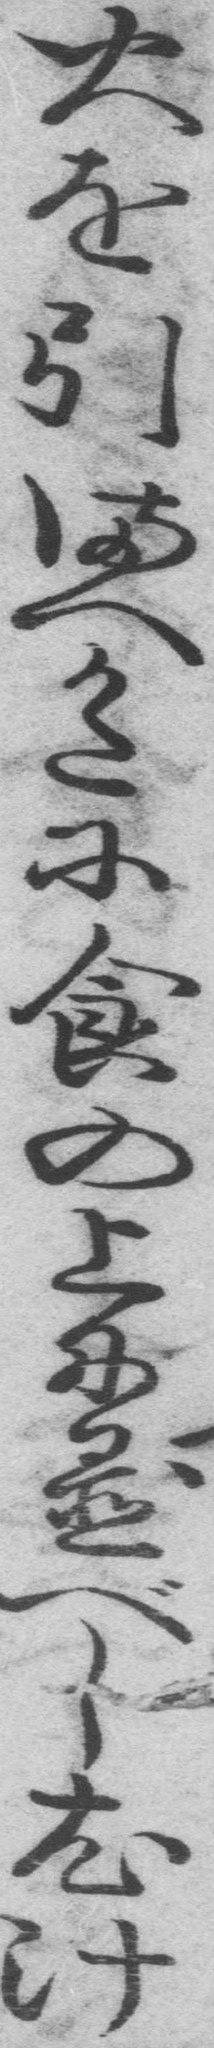火を引満へかた尓食の上丹置べし尤汁
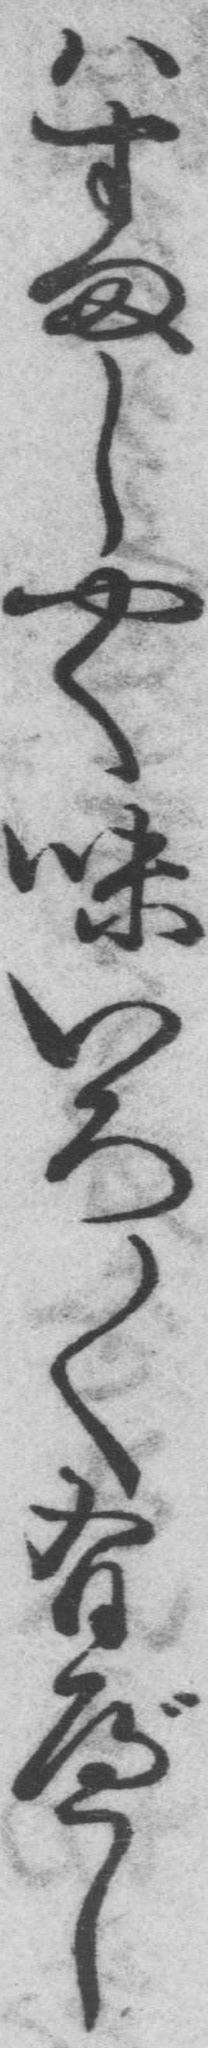はすましやく味いろ〳〵有べし
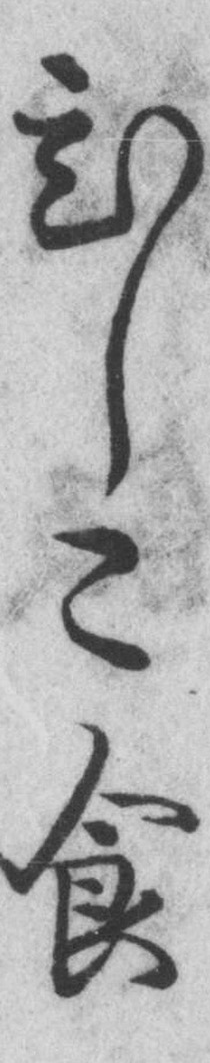飛しこ食
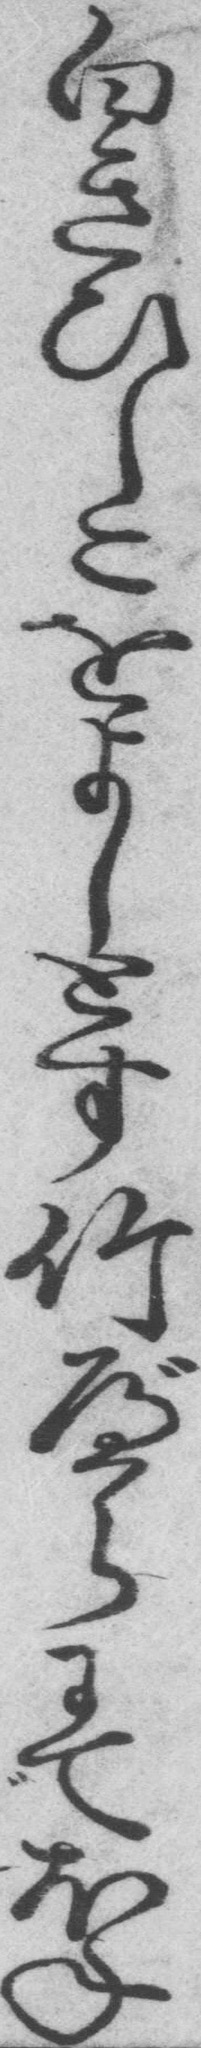白きひしこをよしとす竹べら尓て不年
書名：料理伊呂波庖丁
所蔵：大阪府立大学学術情報センター 国文学研究資料館
